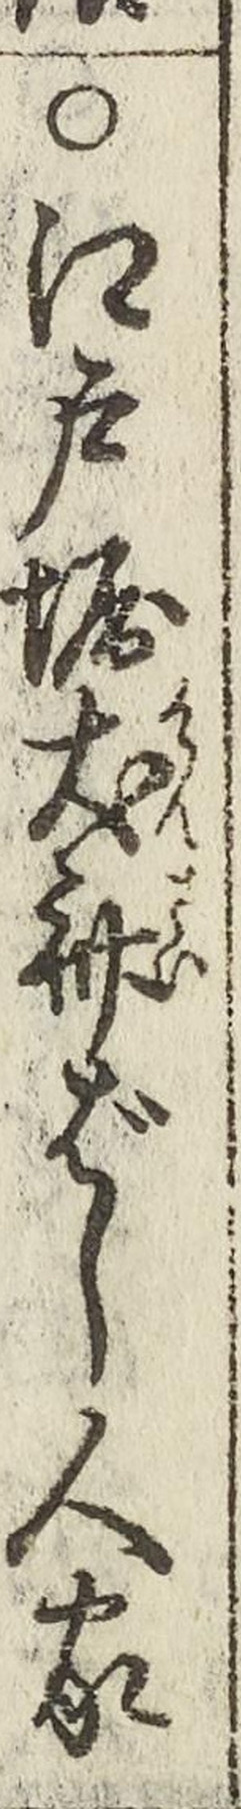○江戸堀犬斎ばし人家
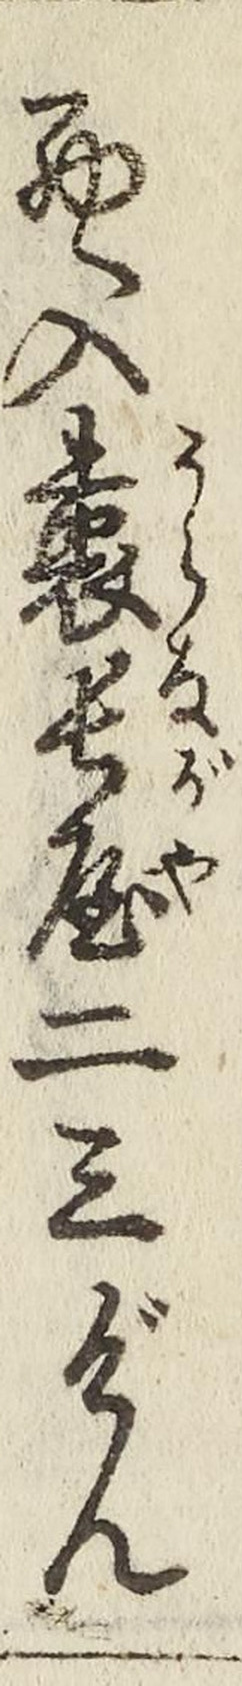西へ入裏長屋二三げん
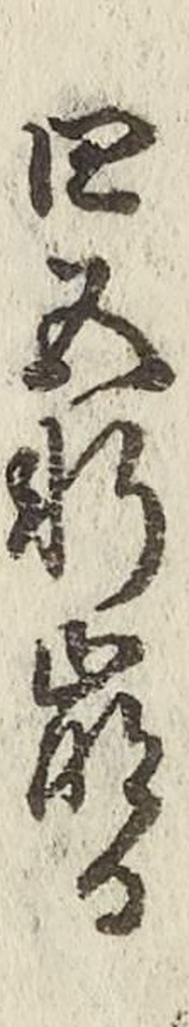四五軒崩る
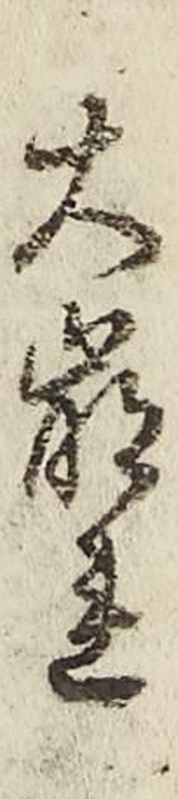大崩れ
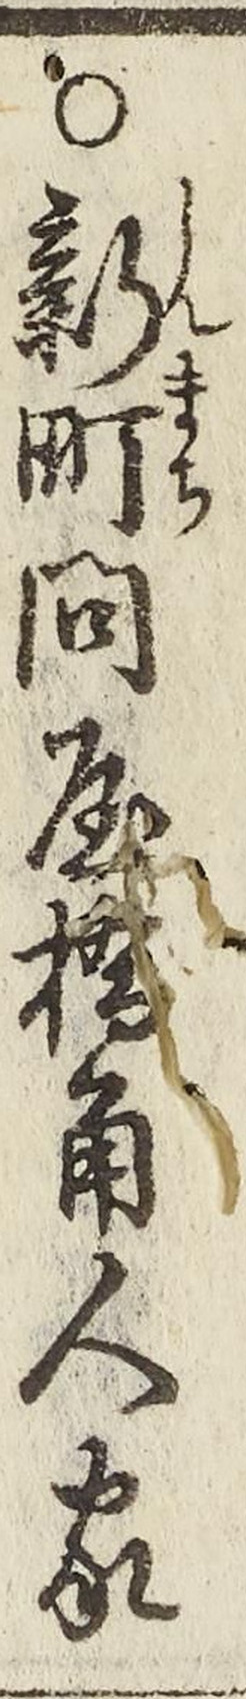○新町問屋橋角人家
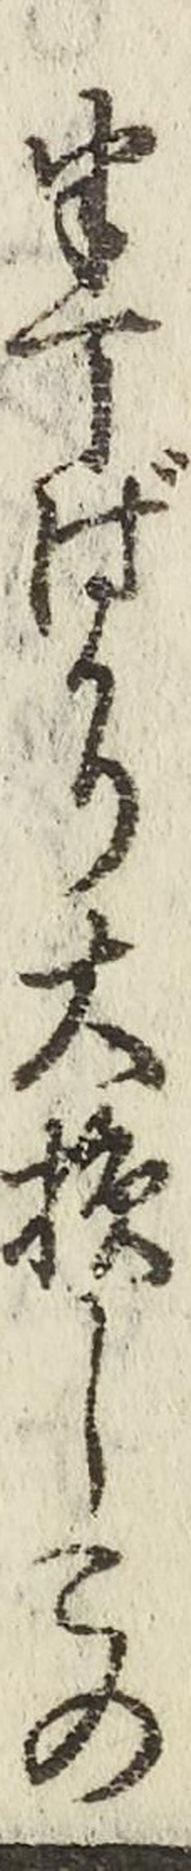半丁ばかり大損しこの
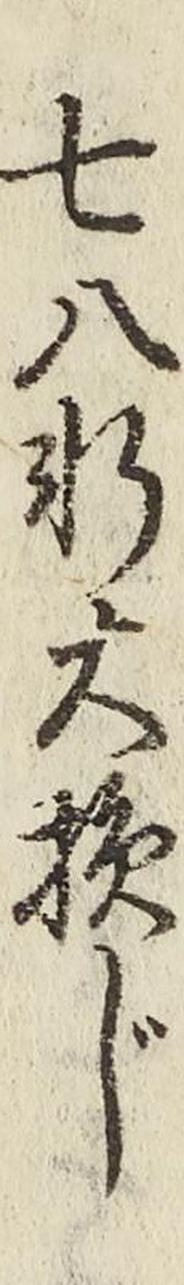七八軒大損じ
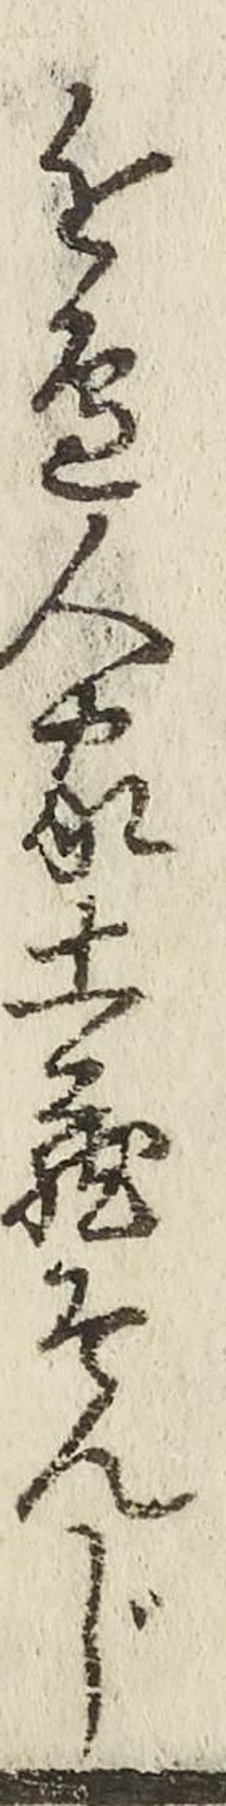近辺人家土蔵そんじ
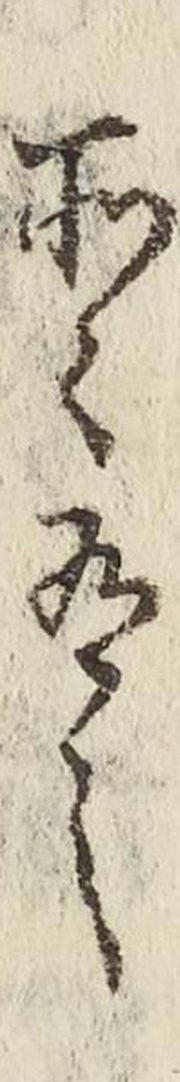所々有之
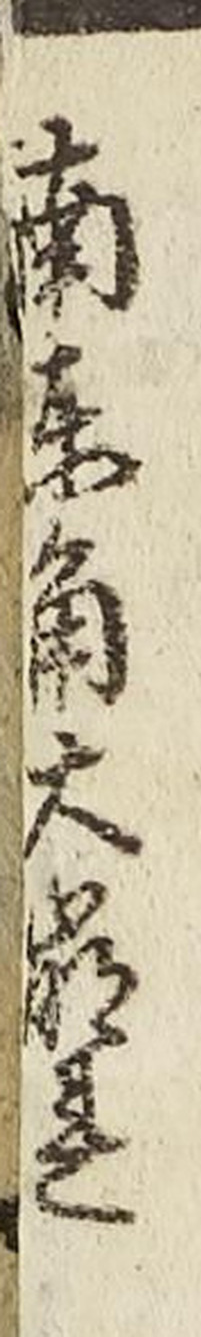南東角大崩れ
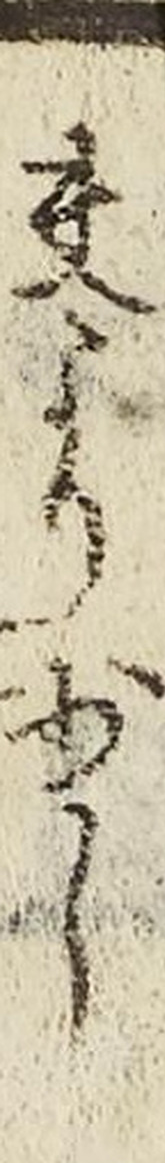夫より少し
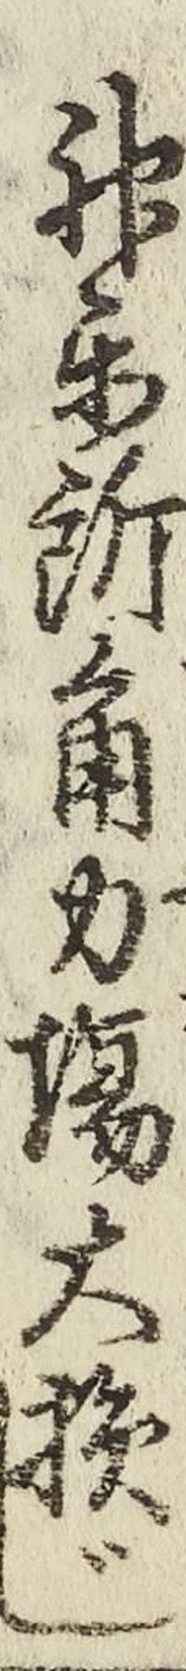神楽所角力場大損じ
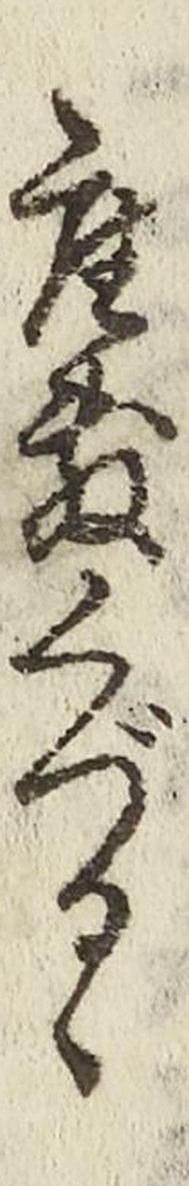座敷くづるゝ
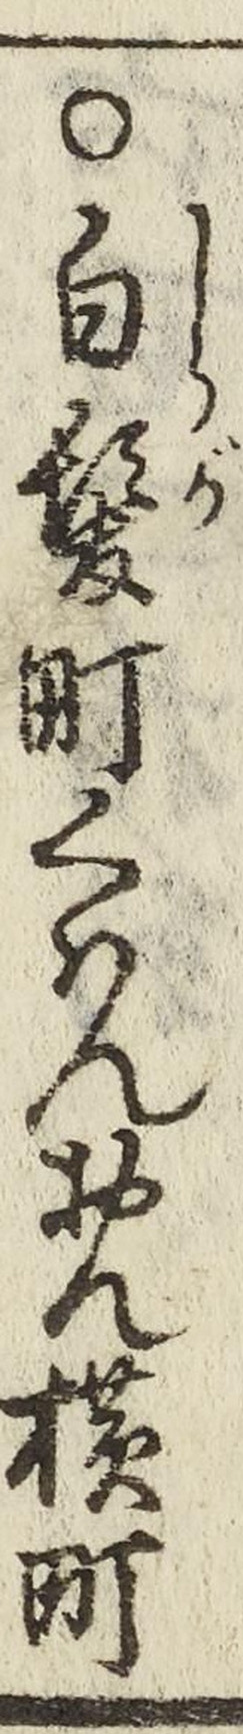○白髪町くわんおん横町
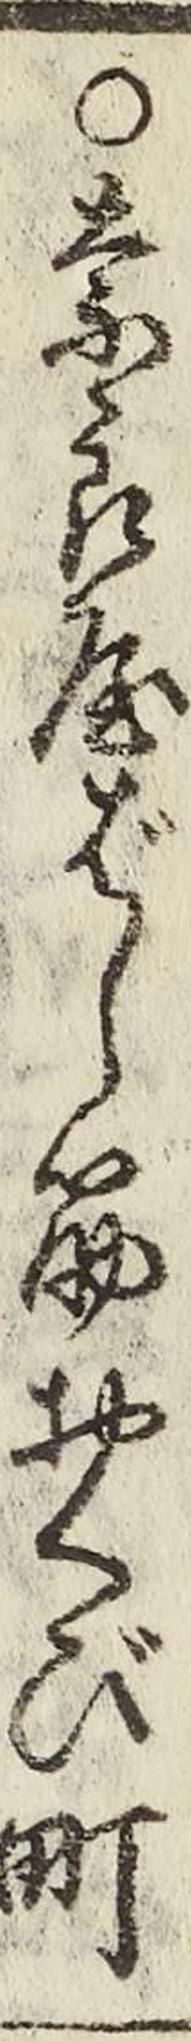○奈良屋ばし筋おくび町
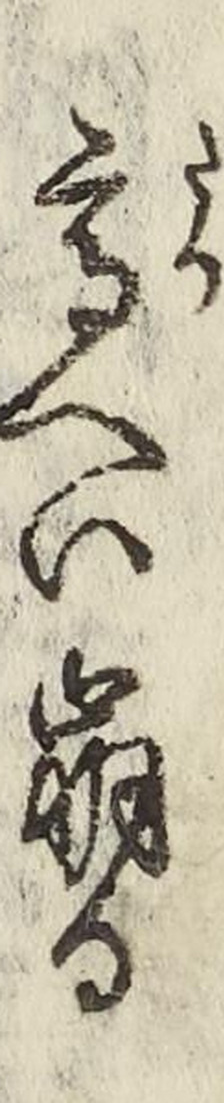高へい崩る
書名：地震津浪末代噺の種　全
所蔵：東京大学地震研究所図書室 Earthquake Research Institute Library, The University of Tokyo, JAPAN
